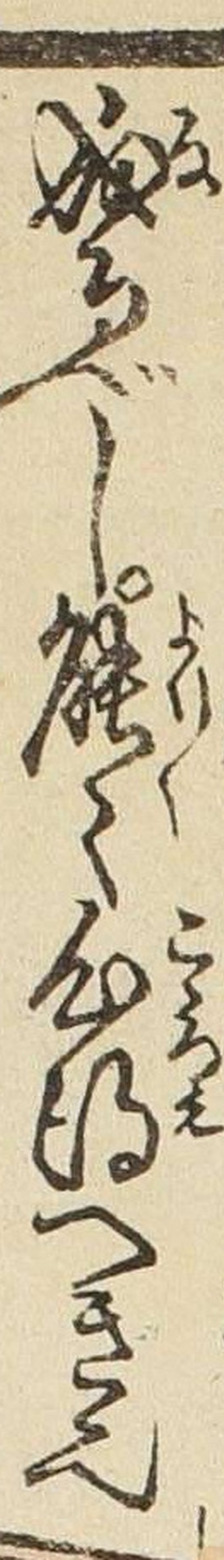成るべし。能々心得へき也
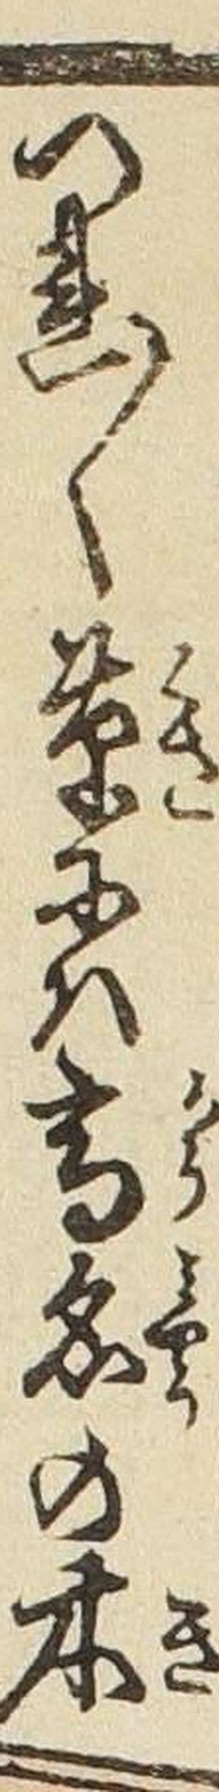つれ〳〵草には高名の木
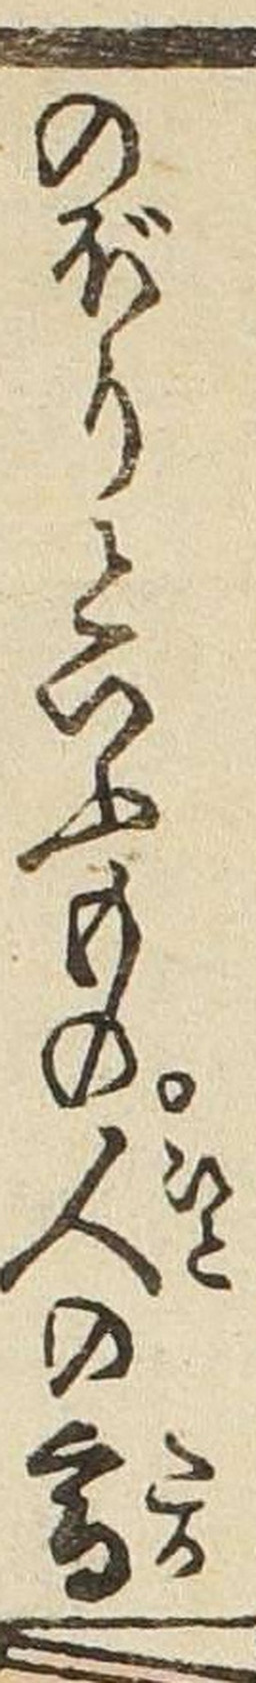のぼりといふもの。人の高
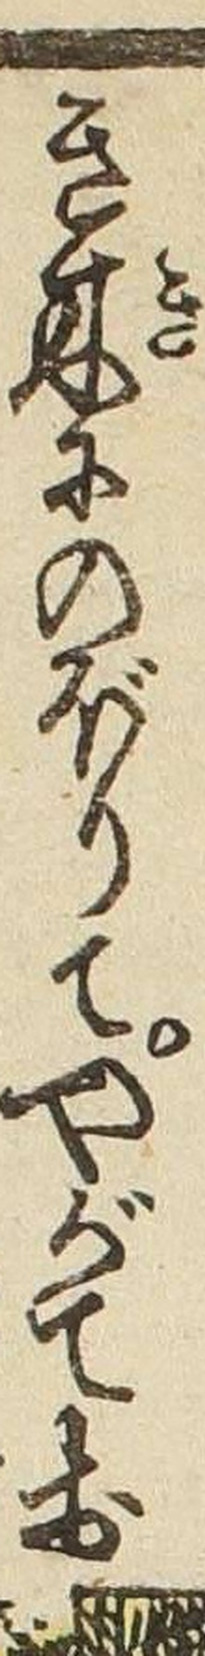き木にのぼりて。やがてお
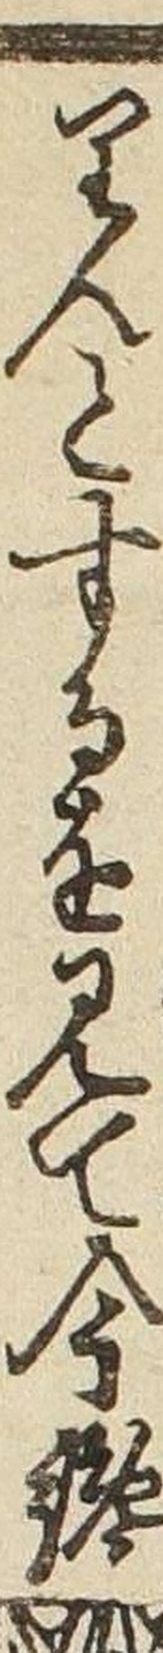りんとするを見て。今纔
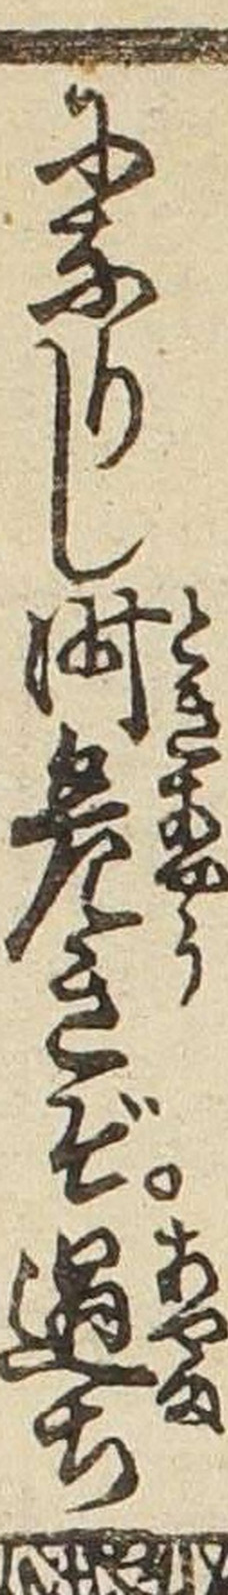になりし時危きぞ。過ち
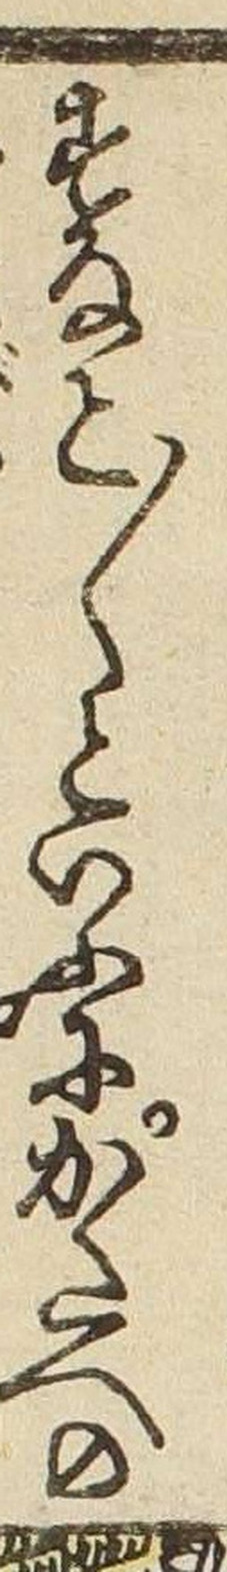すなと〳〵といふに。かたへの
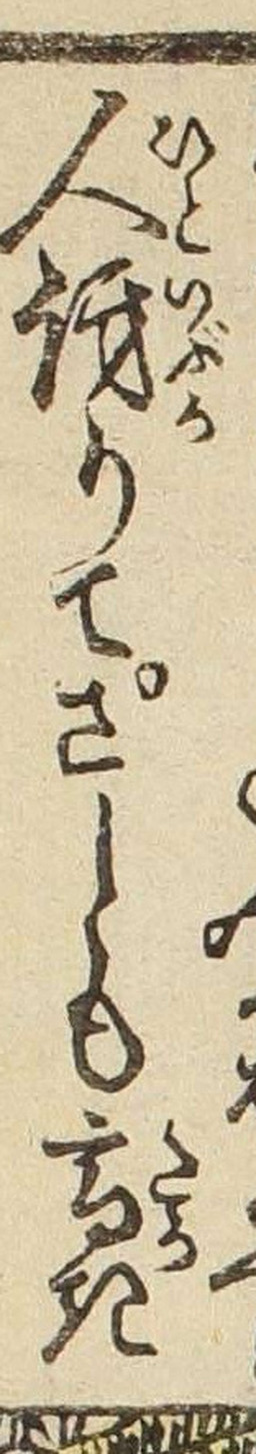人訝りて。さしも高き

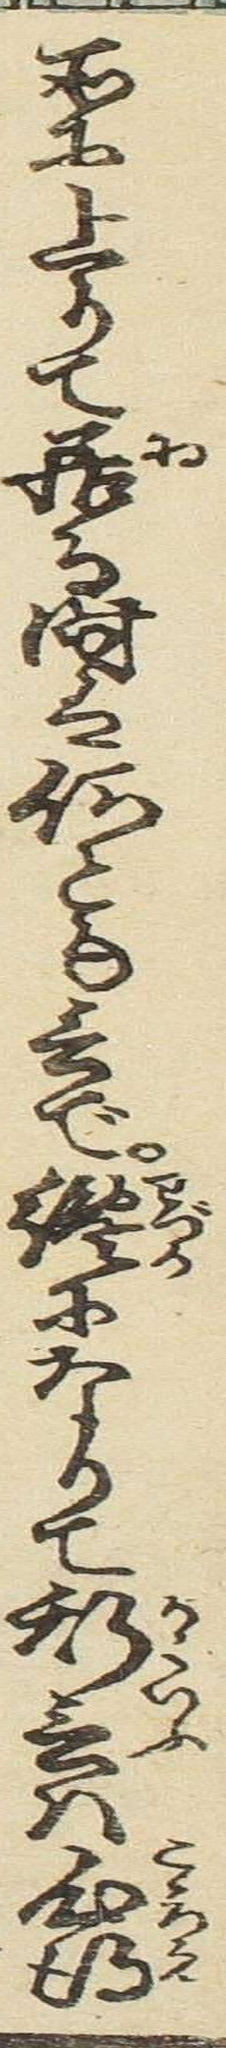所に上りて居る時は何とも言で。纔になりて斯言は心得
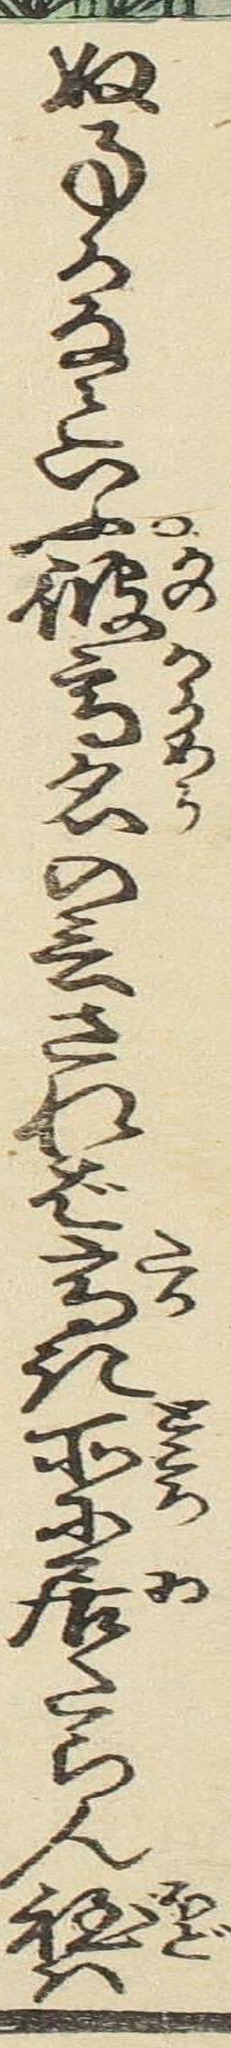ぬ事かなといふ。彼高名の言されば高き所に居たらん程は
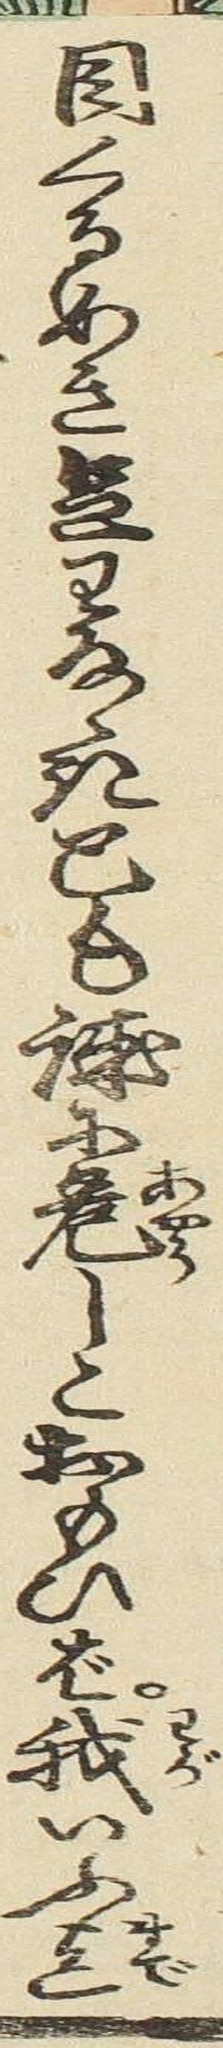目くるめき足わなゝき己も誠に危しとおもひば。我いふ迄
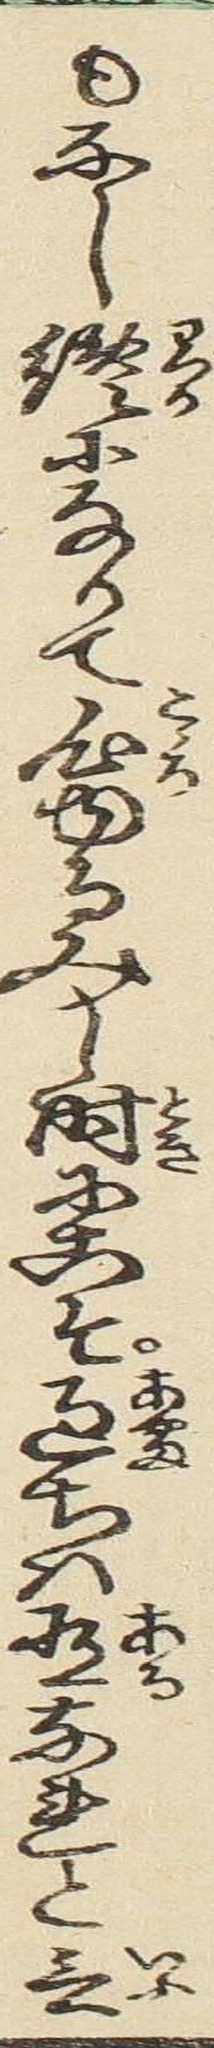もなし纔になりて心ゆるみし時にこそ。過ちは有なれと言
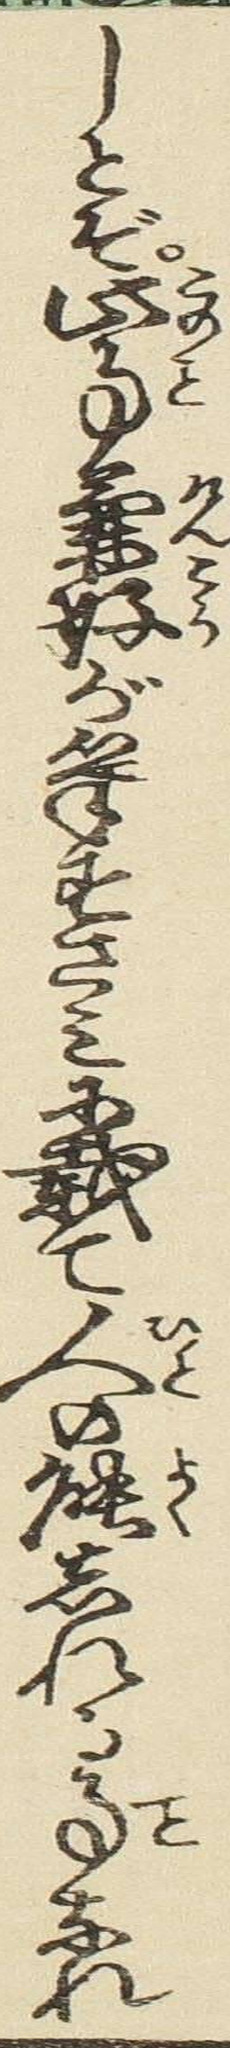しとぞ。此事兼好が筆すさみに載て人の能しれる事なれ
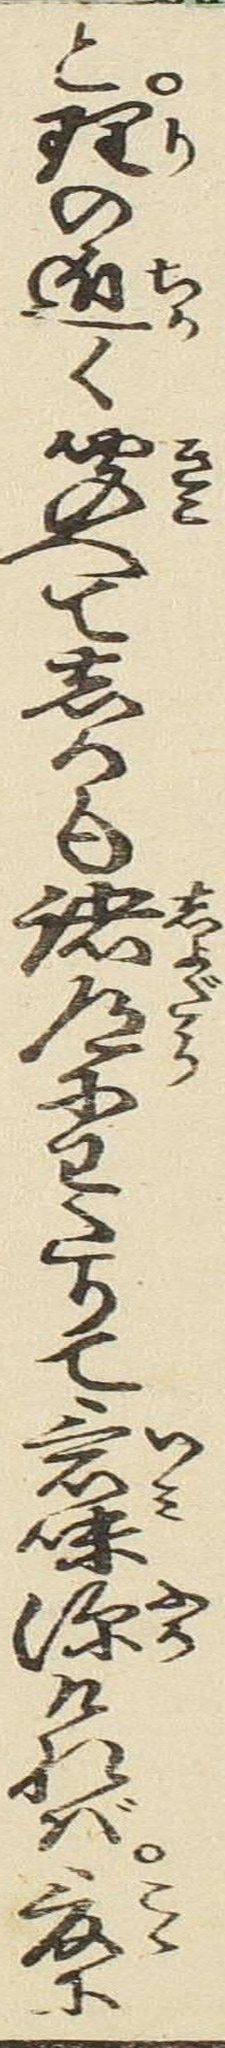と。理の近く聞へてしかも諸道にわたりて意味深ければ。爰に
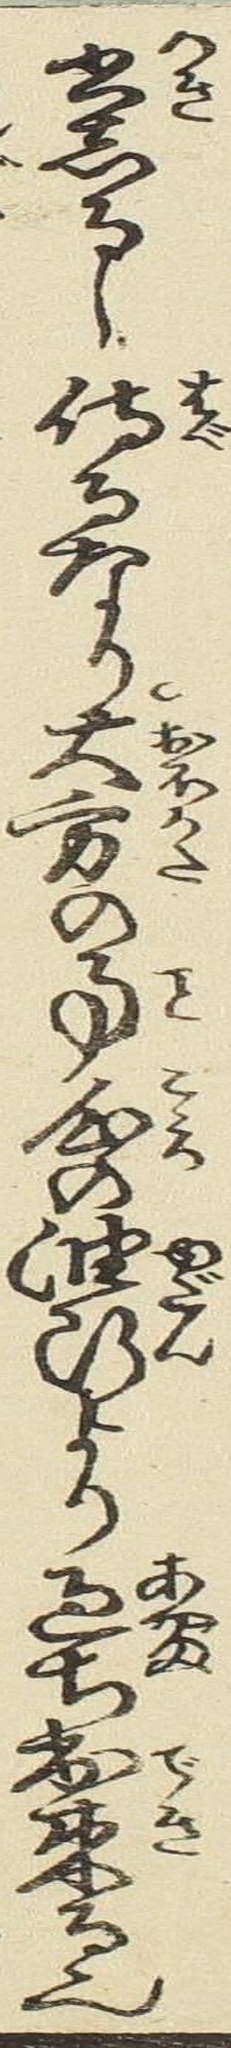書しるし侍るなり。大方の事心の油断より過ち出来る也
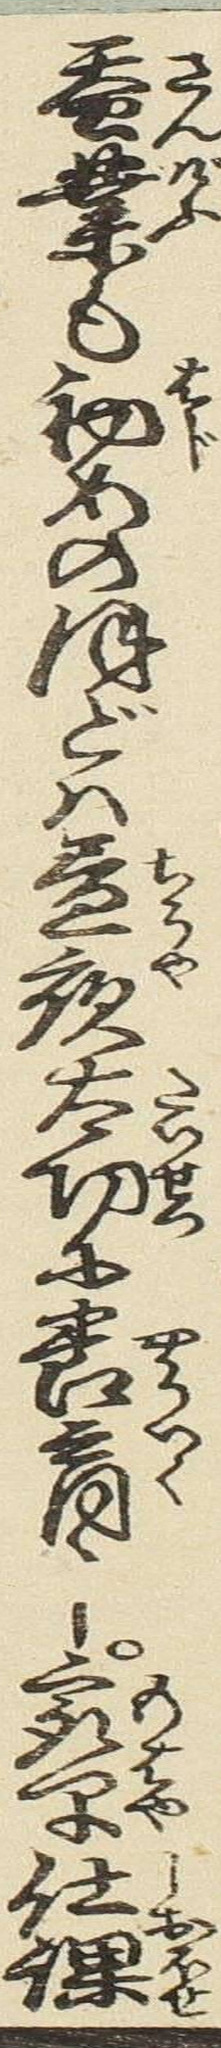蚕業も初めのほどは昼夜太切に養育し。最早仕課
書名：養蠶圖解
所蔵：東京大学農学生命科学図書館 国文学研究資料館
